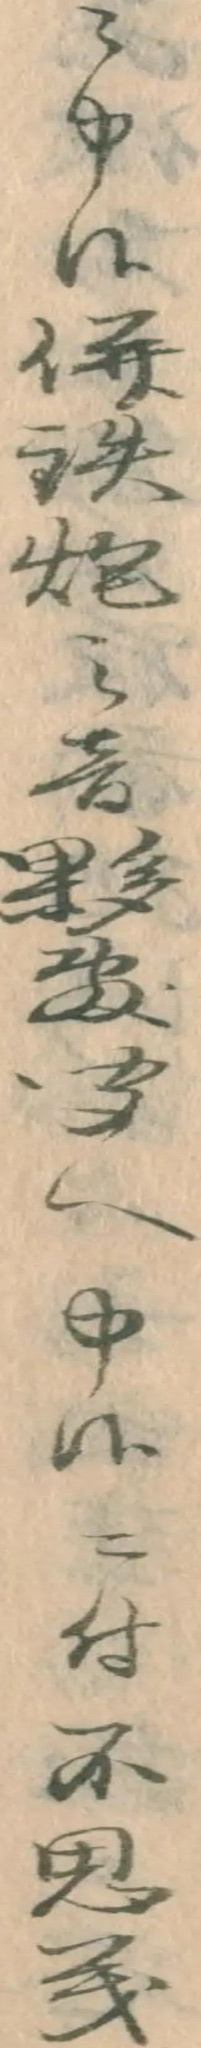に申候併鉄炮之音夥敷聞へ申候に付不思義
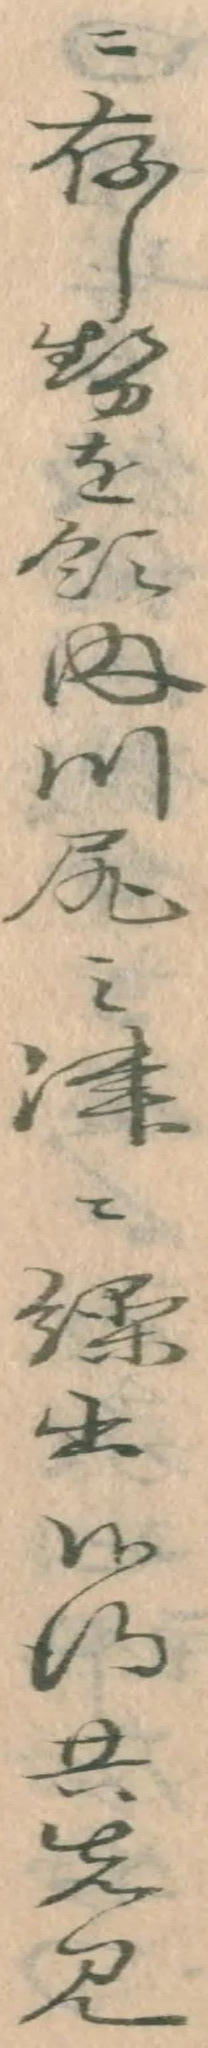に存し勢を領内川尻之津に繰出候得共先見
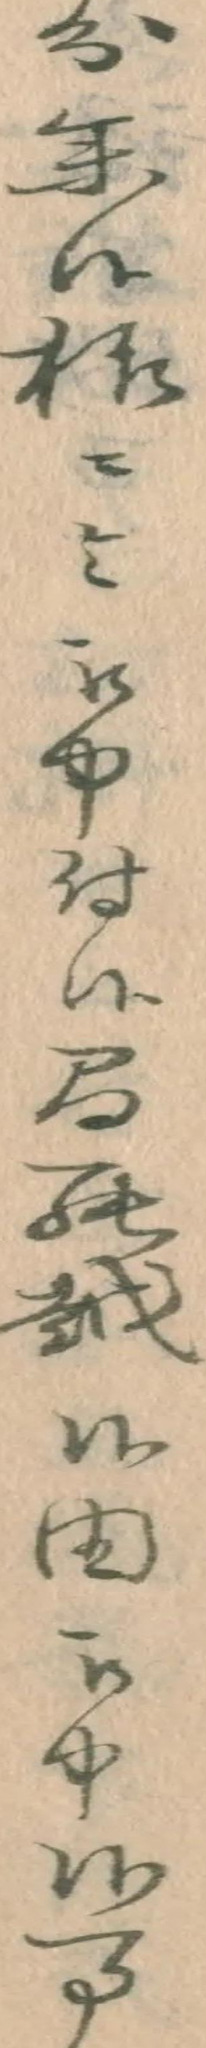分参候様に与被申付候間罷越候由被申候事
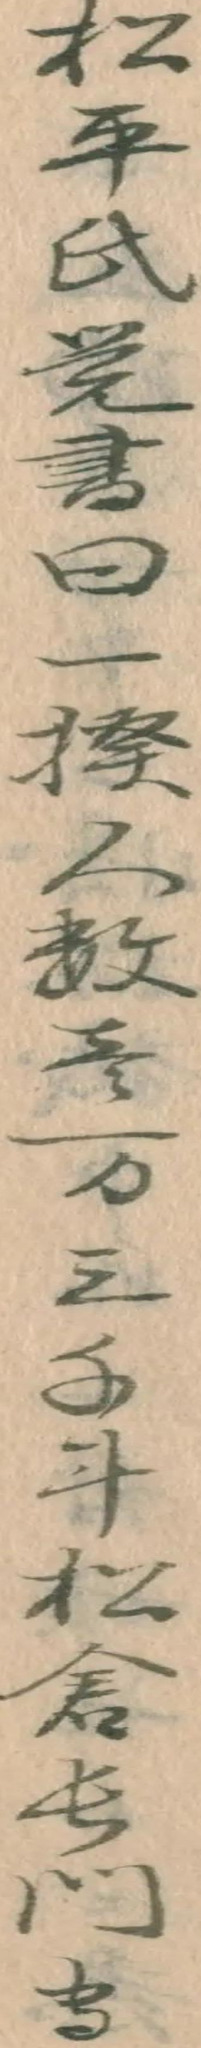松平氏覚書曰一揆人数壱万三千斗松倉長門守
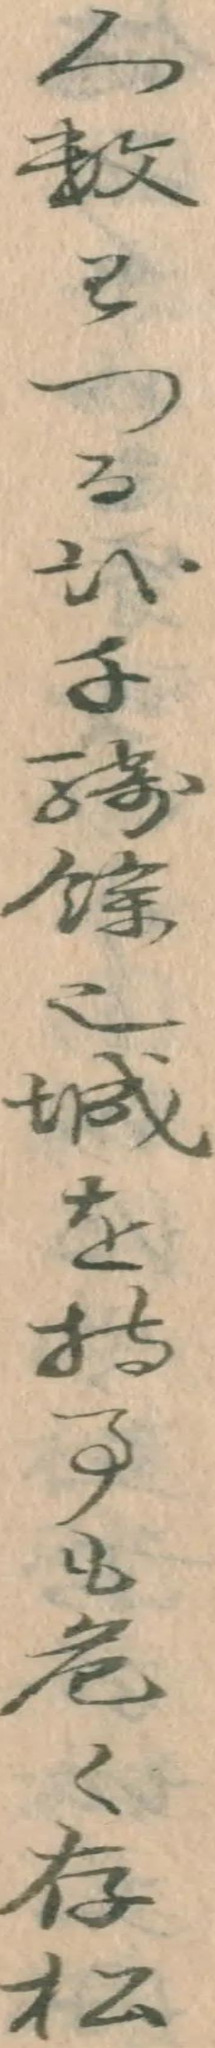人数己つる弐千騎余也城を持事も危く存松
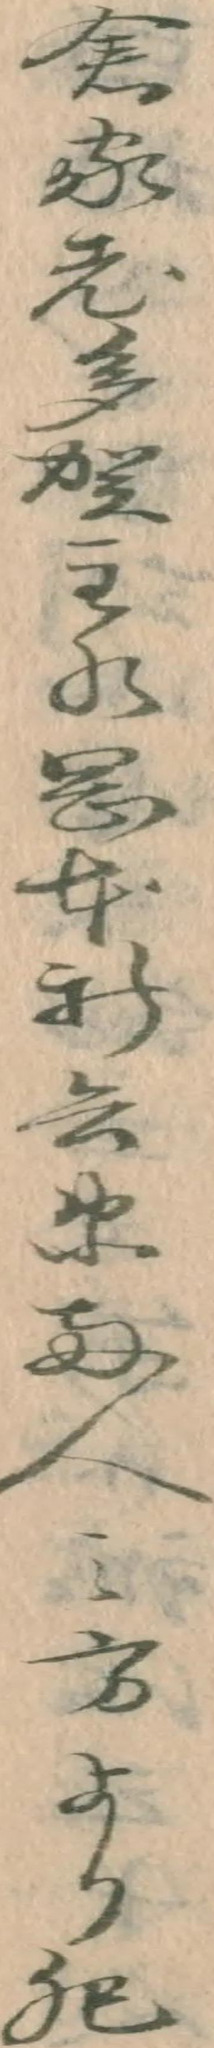倉家老多賀主水岡本新兵衛両人之方より肥
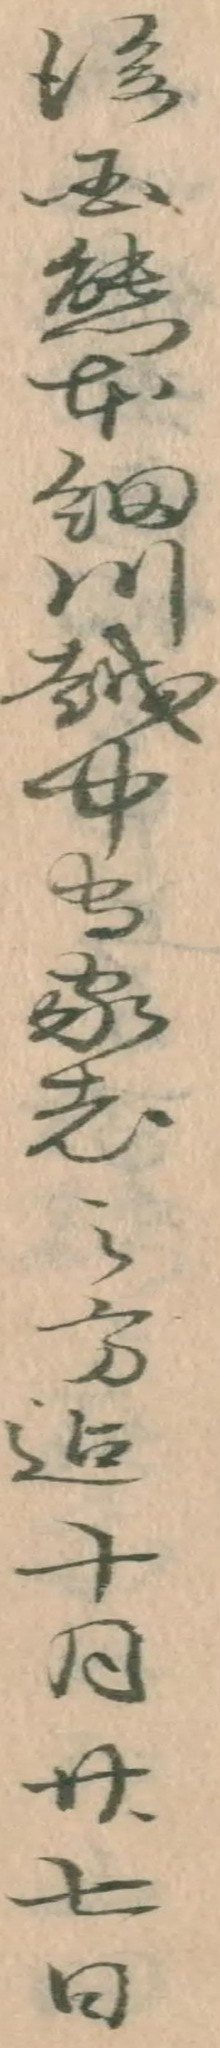後国熊本細川越中守家老之方迄十月廿七日
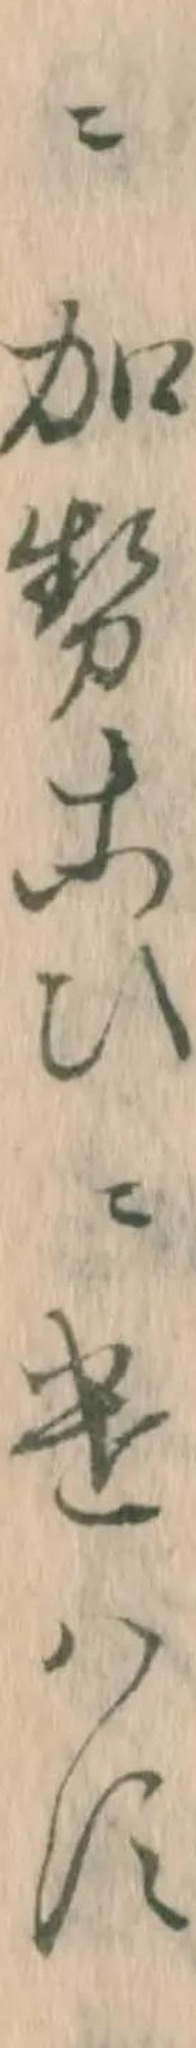に加勢古ひに遣は須
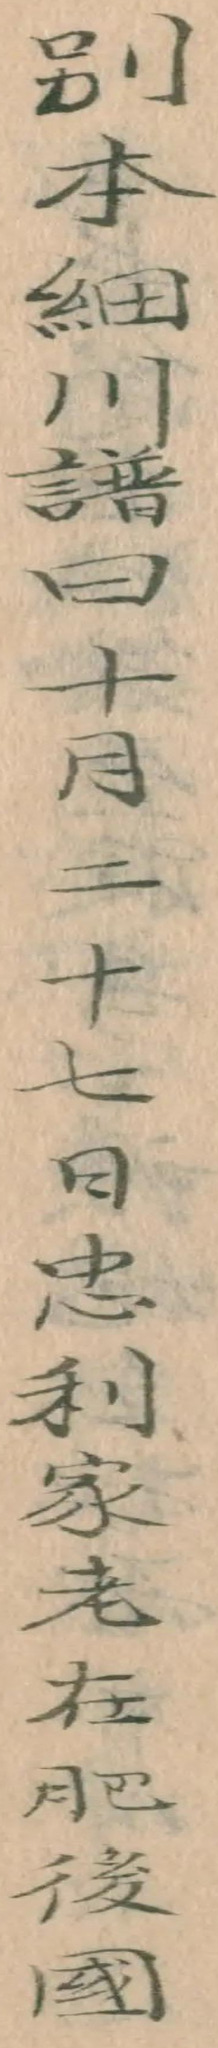別本細川譜曰十月二十七日忠利家老在肥後国
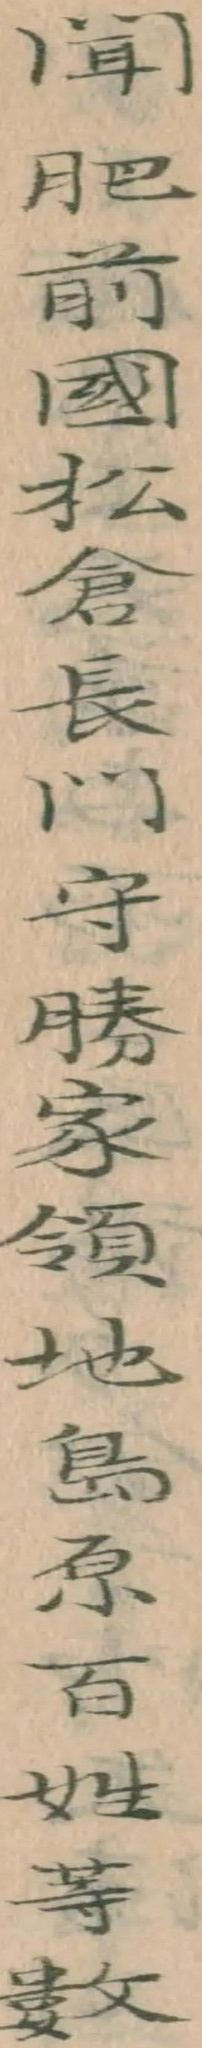聞肥前国松倉長門守勝家領地島原百姓等数
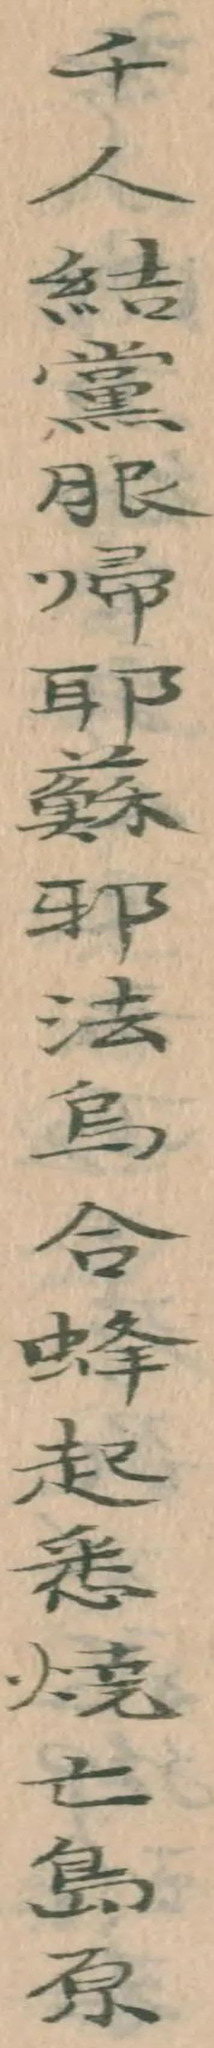千人結党服帰耶蘇邪法島合蜂起悉焼亡島原
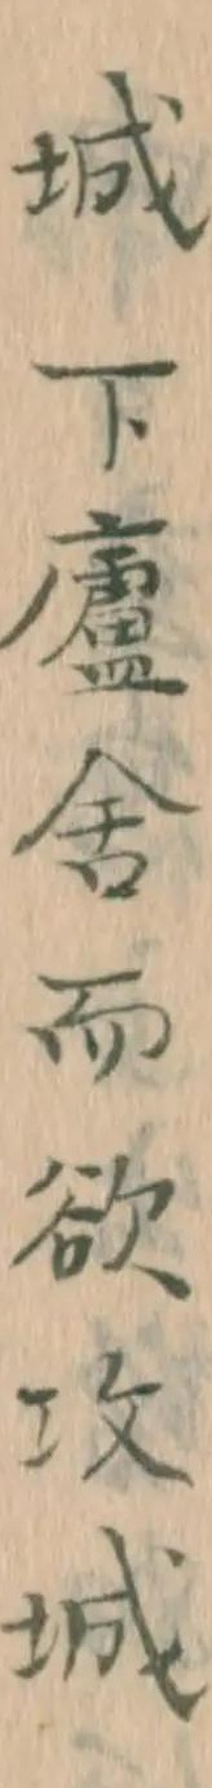城下盧舎而欲攻城
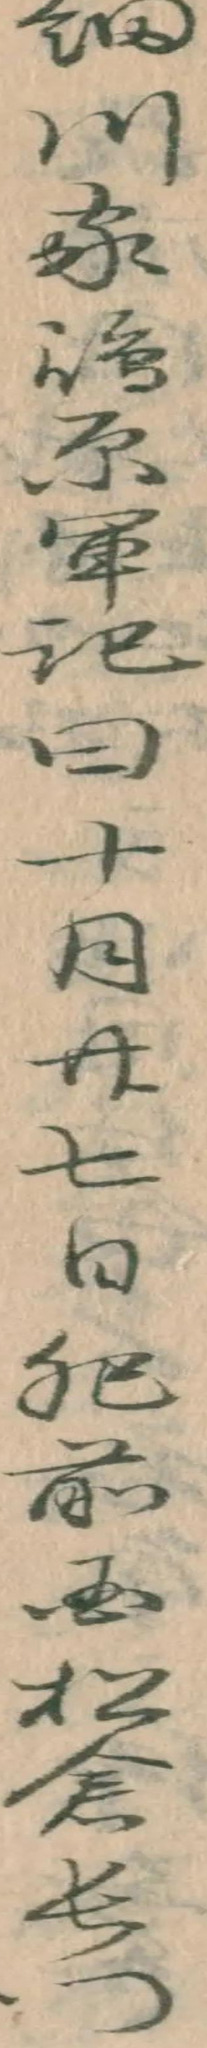細川家島原軍記曰十月廿七日肥前国松倉長門
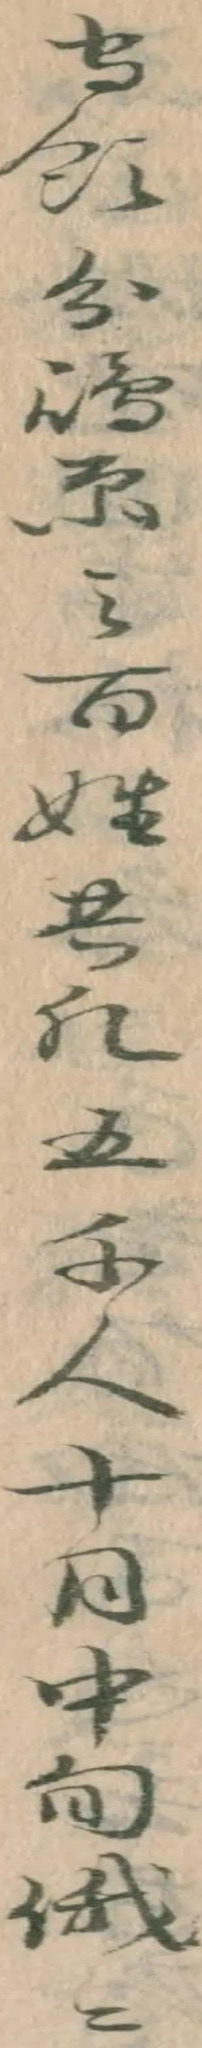守領分島原之百姓共凡五千人十月中旬俄に
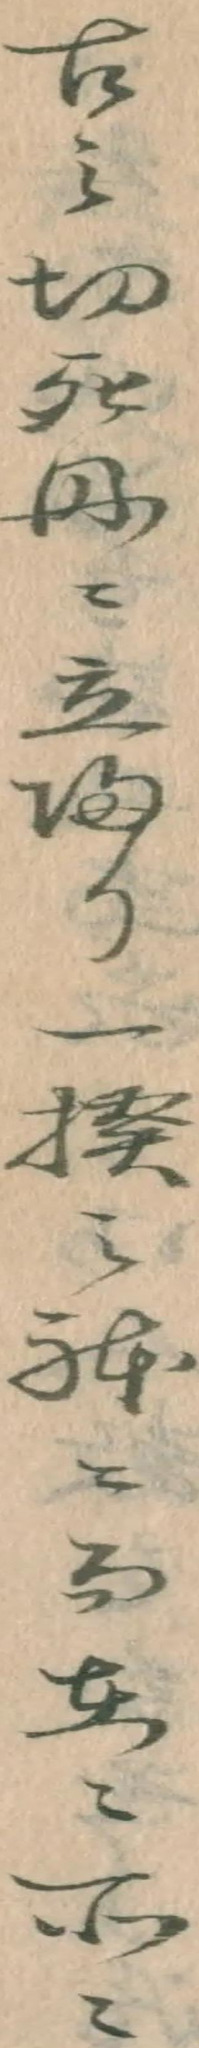古之切支丹に立帰り一揆之躰に而在々所々
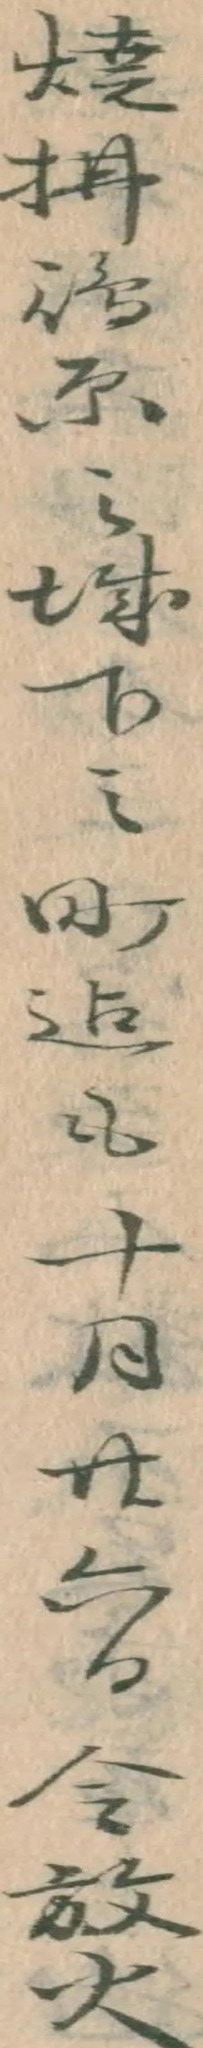焼払島原之城下之町迄も十月廿六日令放火
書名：切支丹御退治記 49巻. [2]
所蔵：国立国会図書館 National Diet Library, JAPAN
